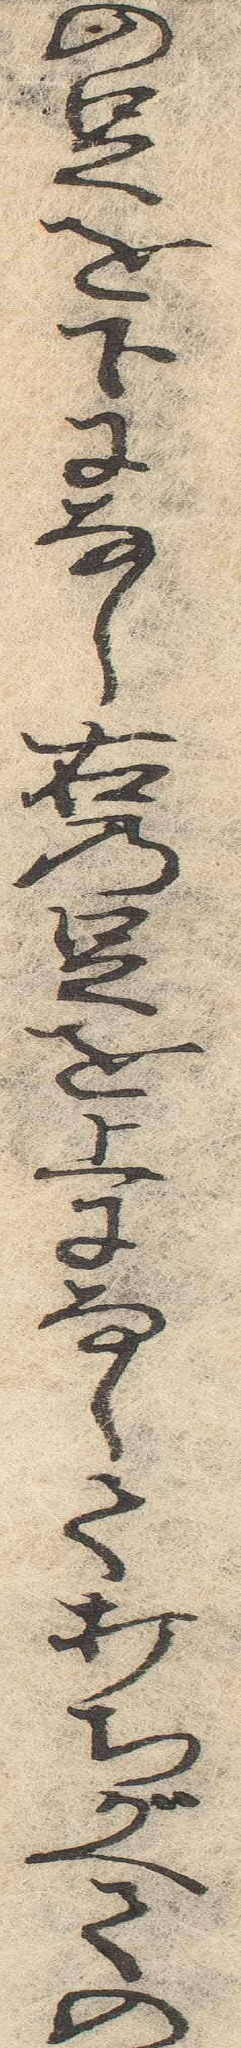の足を下になし右の足を上になして打ちがへての
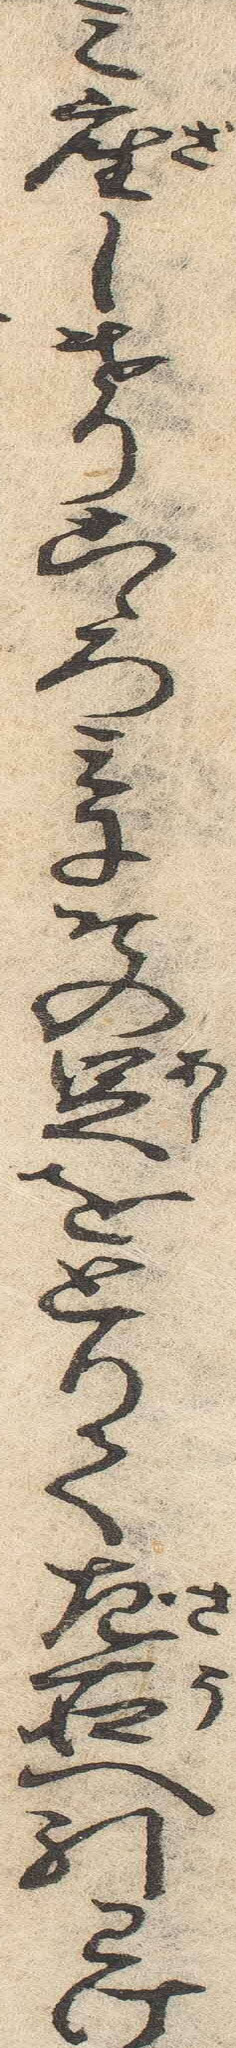み座しけりこゝろみにその足をとりて左右へ引わけ
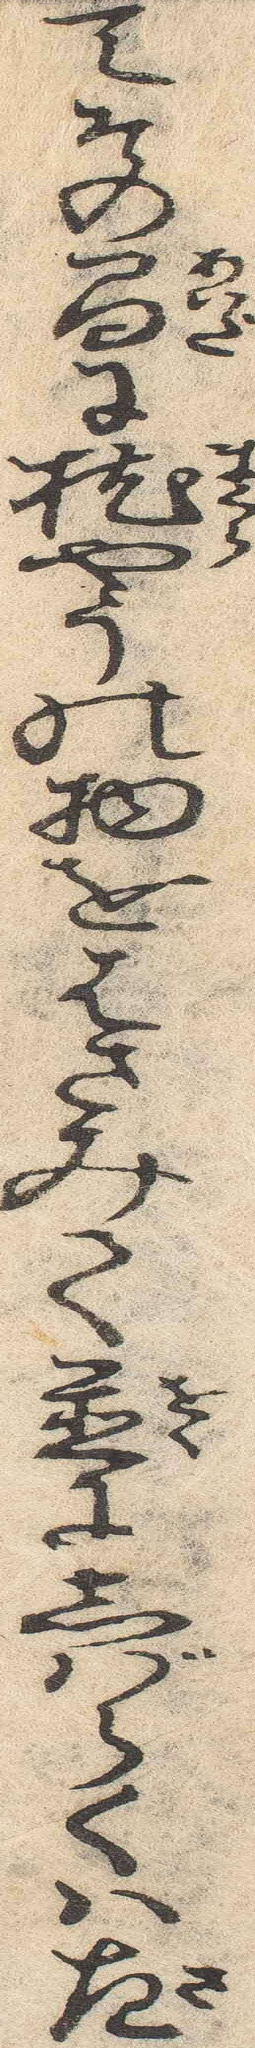てその間に枕やうの物をはさみて置にしばらくは左
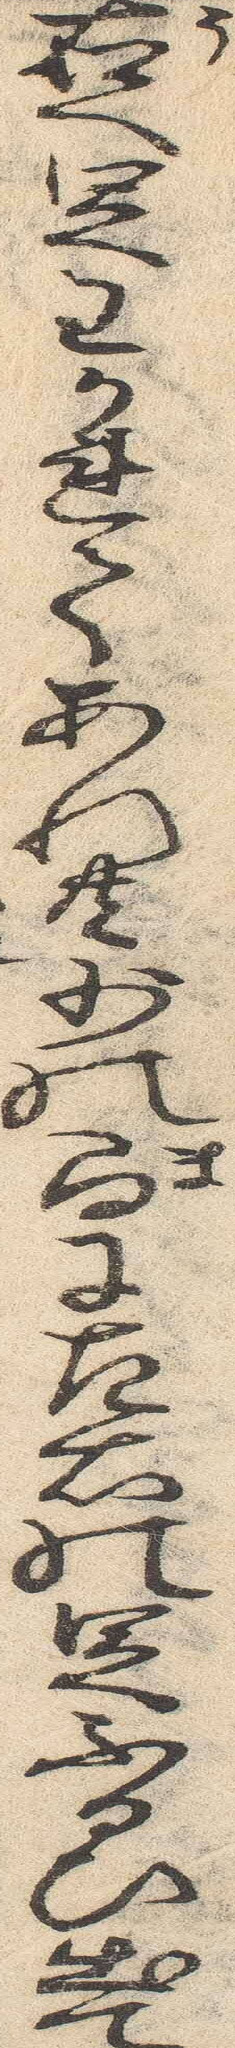右へ足わかれてあれ共少の間に左右の足ふるひ出て
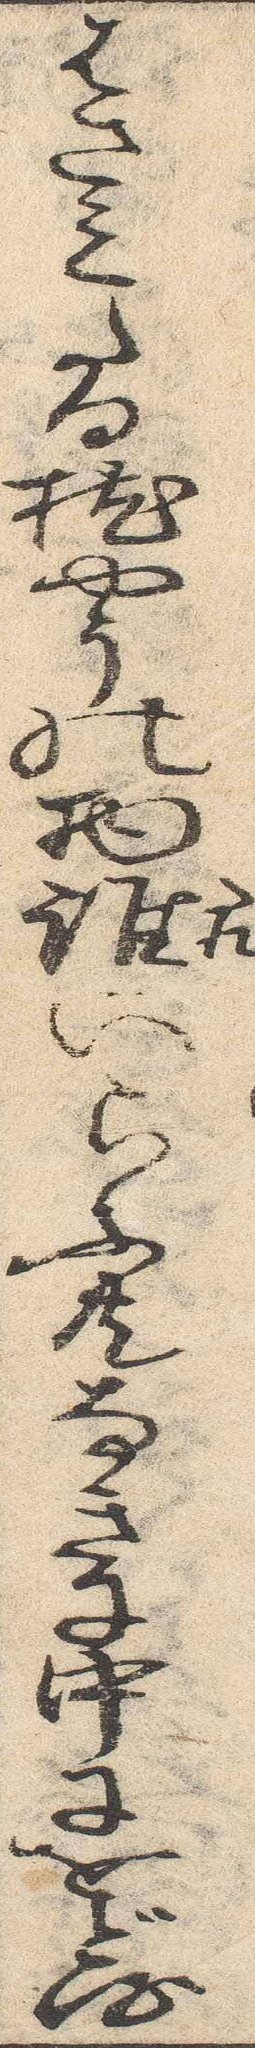はさみたる枕やうの物誰いらふ共なきに中にをどる
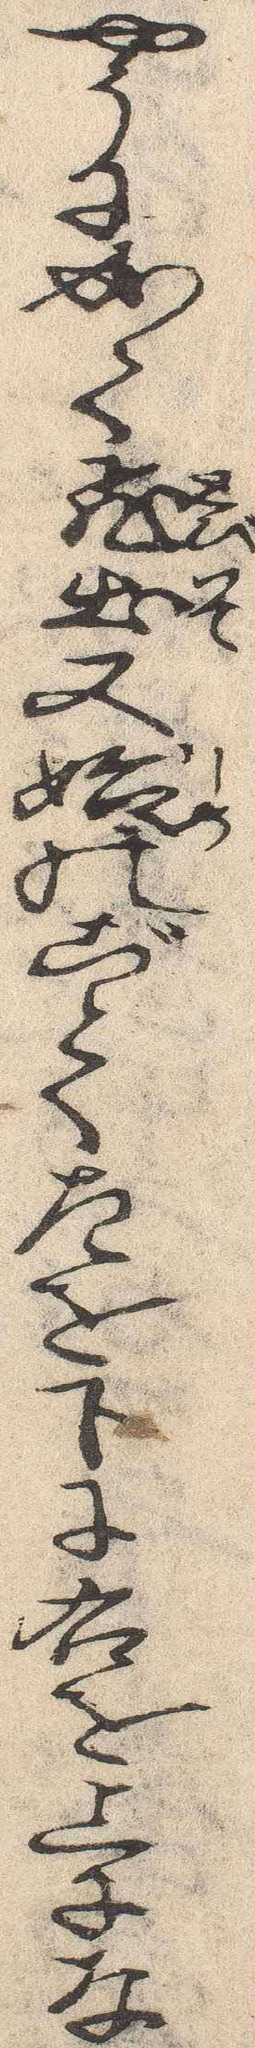やうに成て飛出又始のごとく左を下に右を上にな
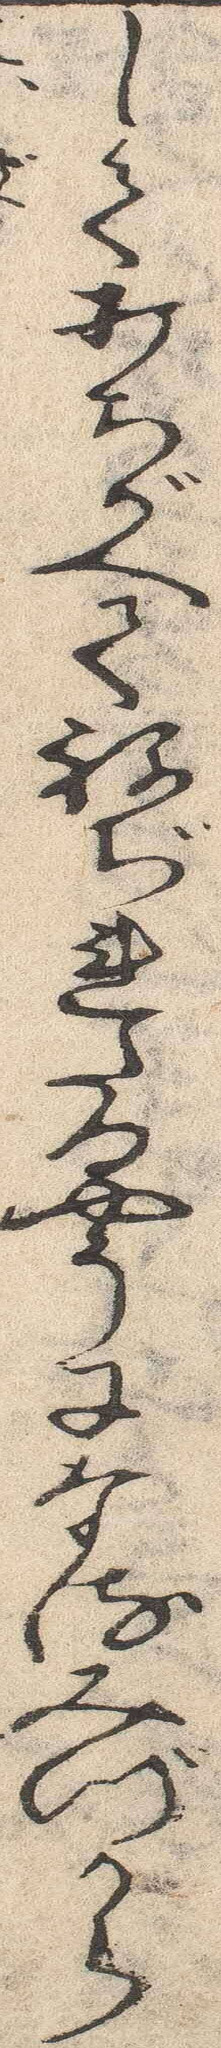して打ちがへてねぢれたるやうになるみづから
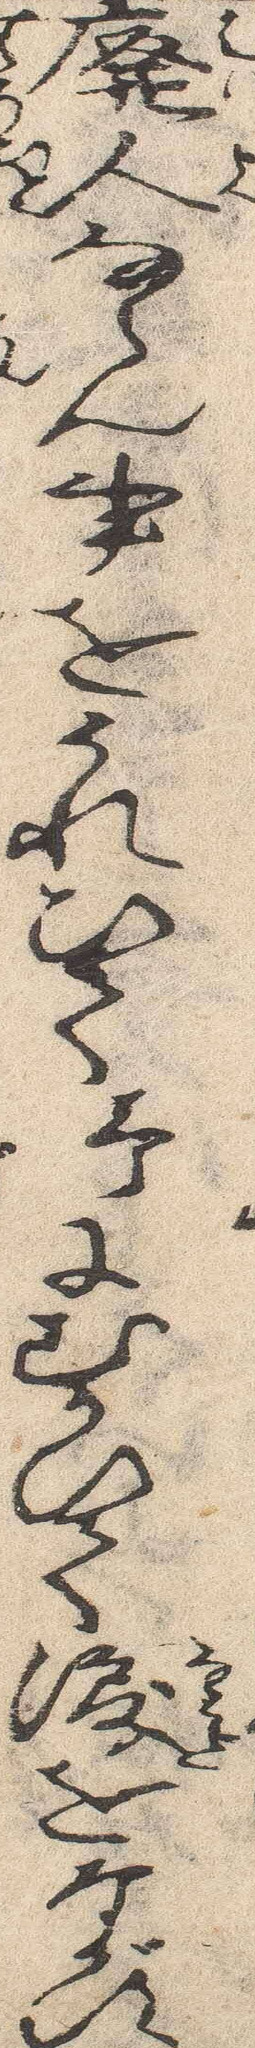廃人ならん事をうれひて予にむかひて涙をながす
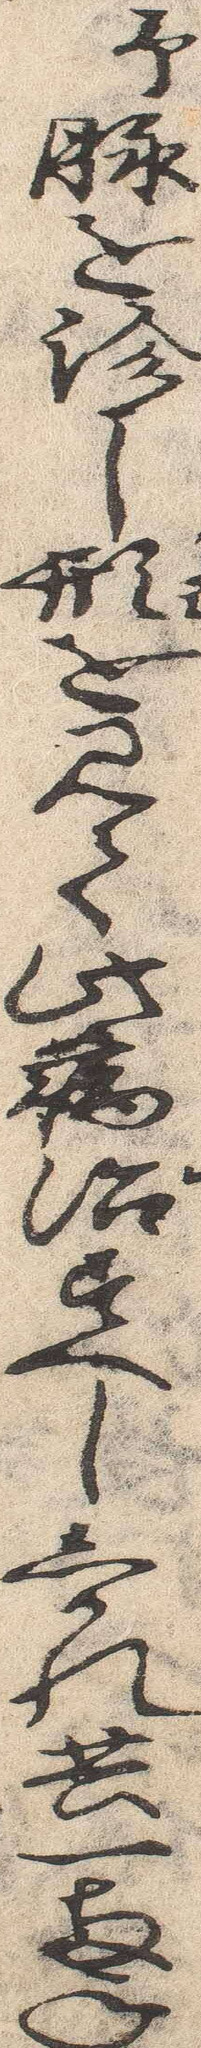予膝を診し形を見て此病治すへししかれ共一両年
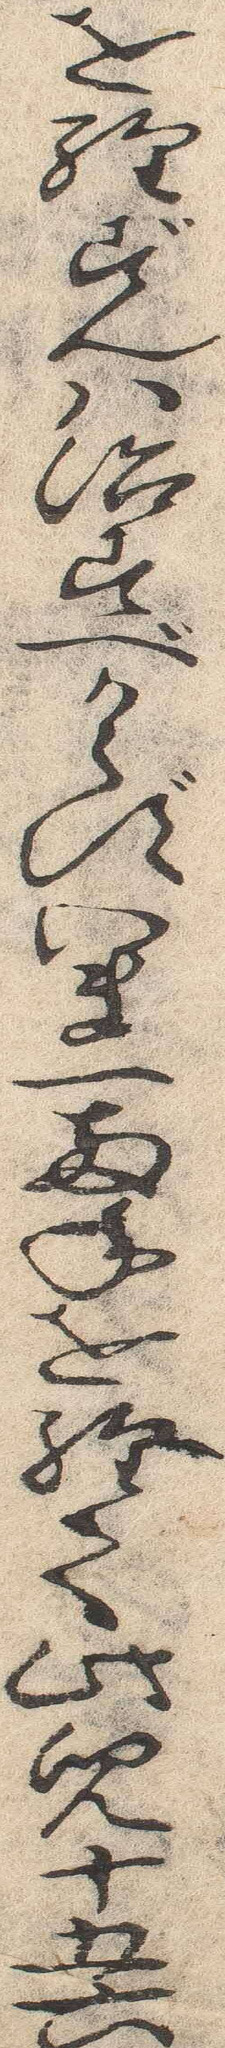を経ずんは治すべからずいま一両年を経て此児十五六
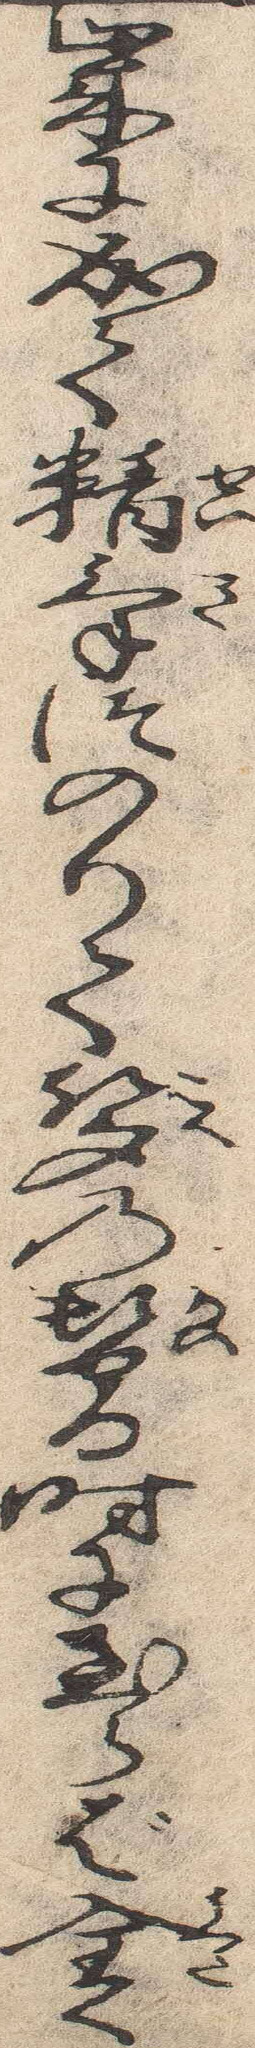歳に成て精気つのりて声の替る時に至らば全く
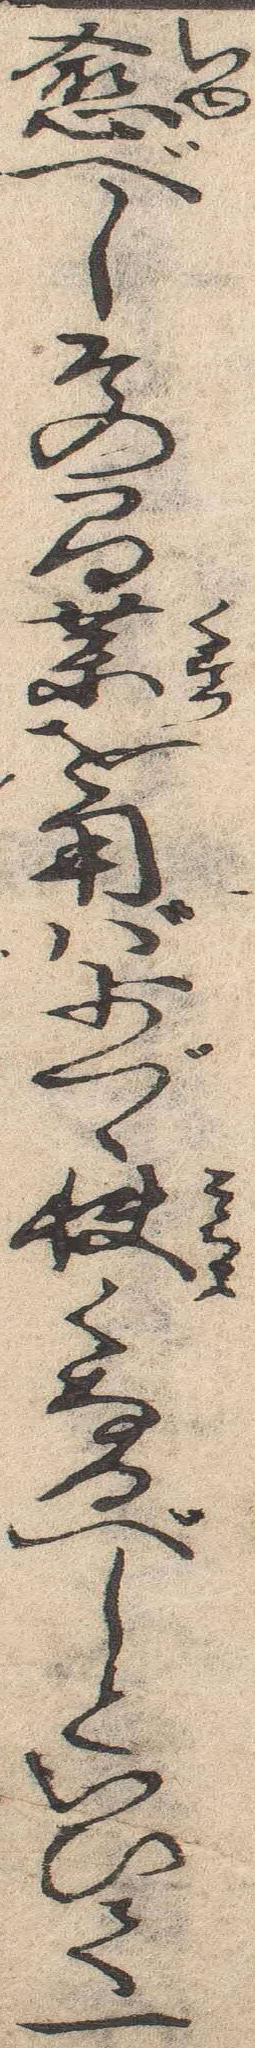愈べしその間薬を用ば少づゝ快くなるべしといひて一
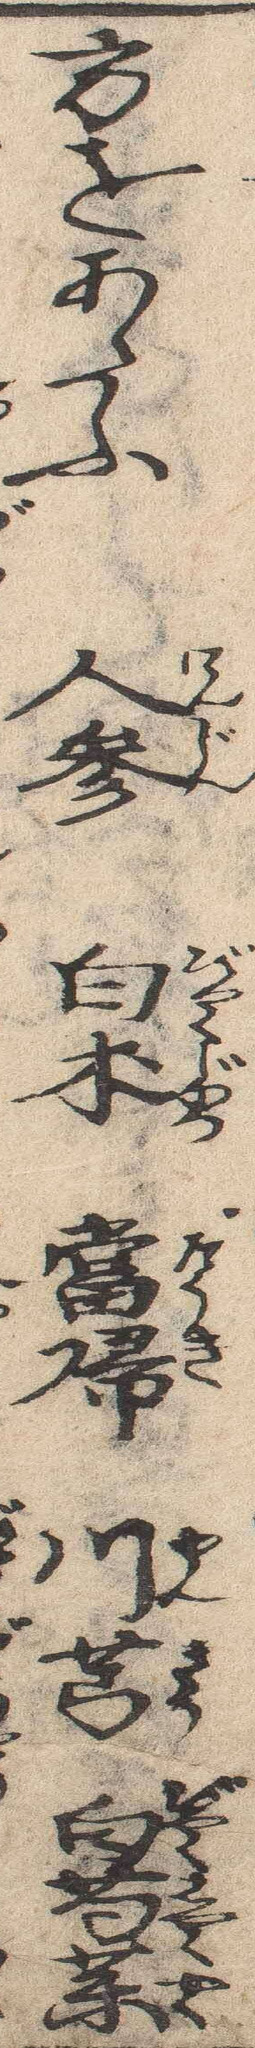方をあたふ人参白朮当帰川芎白芍薬
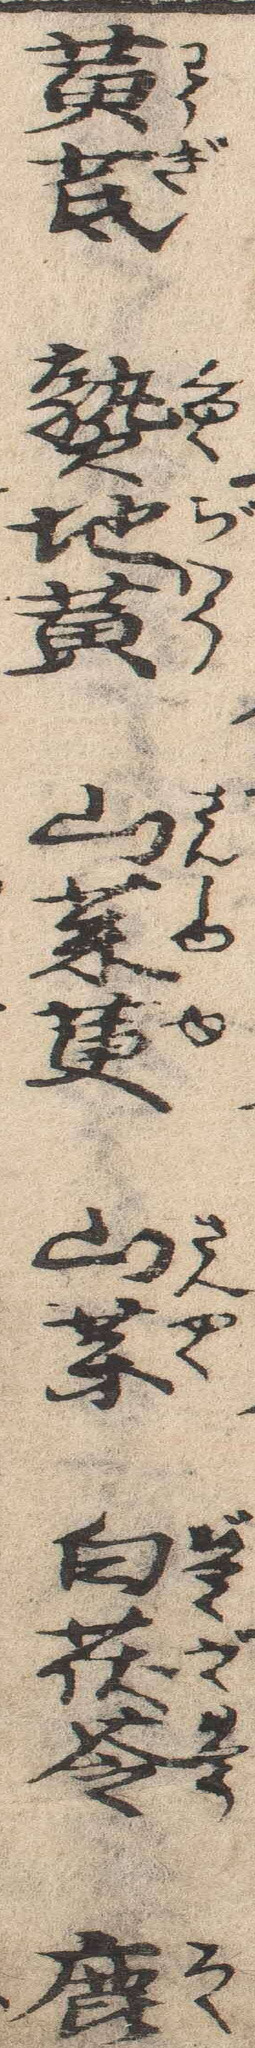黄茋熟地黄山茱萸山薬白茯苓鹿

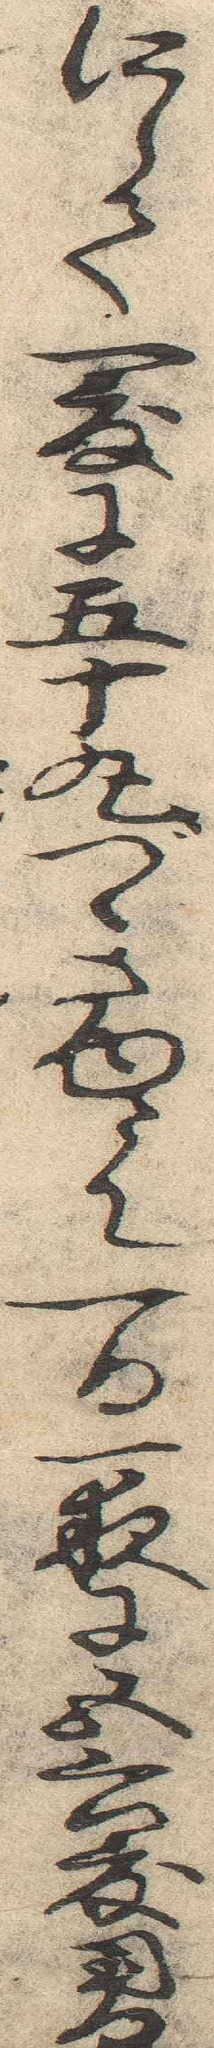にして爰に五十丸づゝさゆにて一日一夜に五六度用る
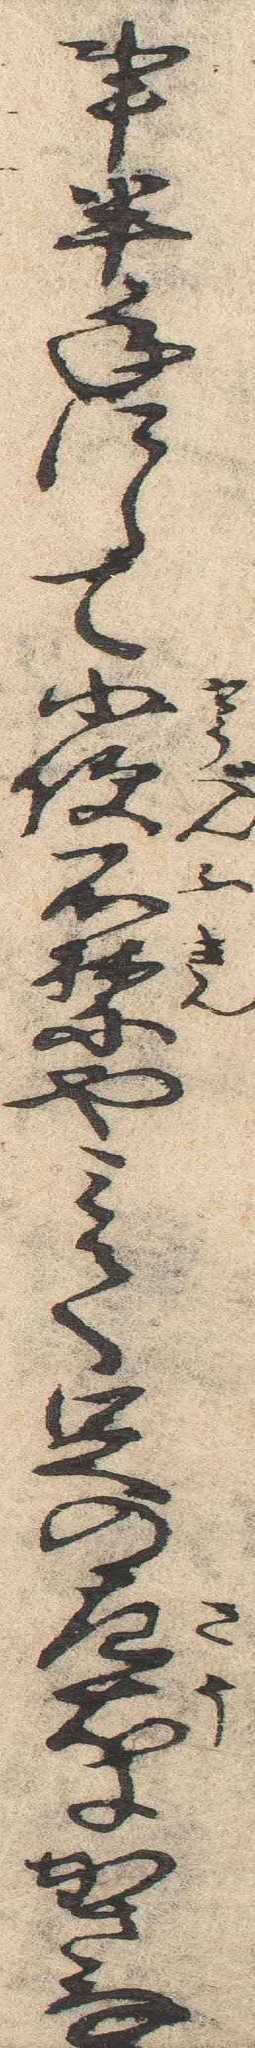事半年にして小便不禁やみて足の左右にかさな
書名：小児必用養育草
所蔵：東京学芸大学附属図書館 国文学研究資料館
